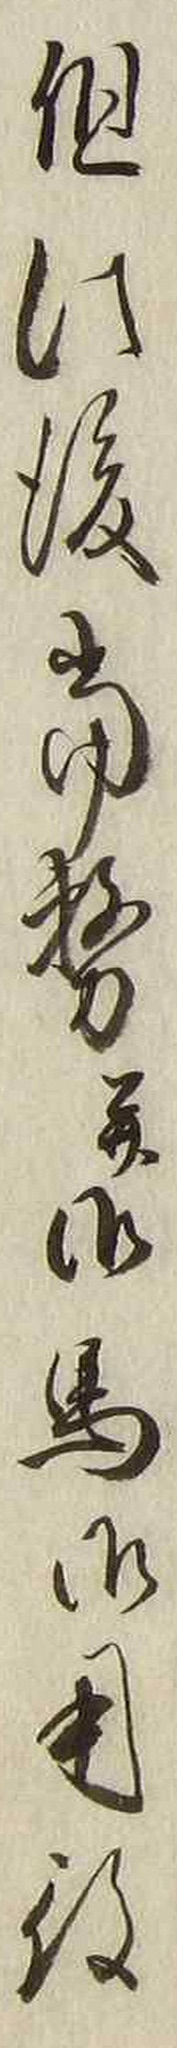但此後当務并御馬御用役
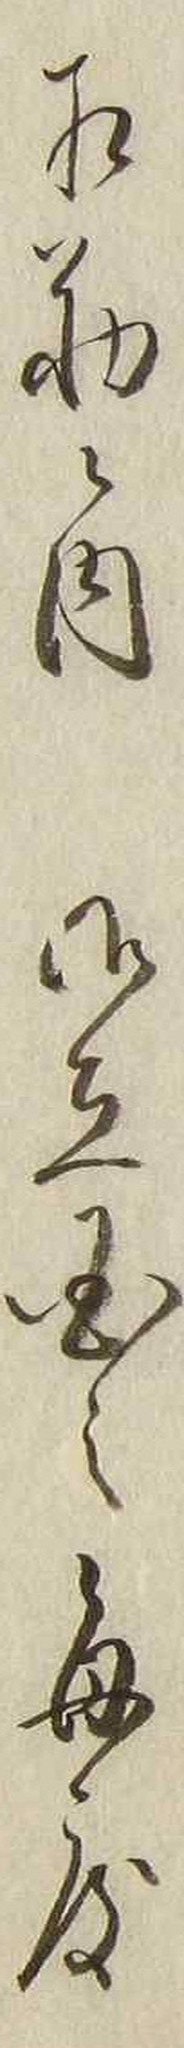相勤候内御在国之毎度

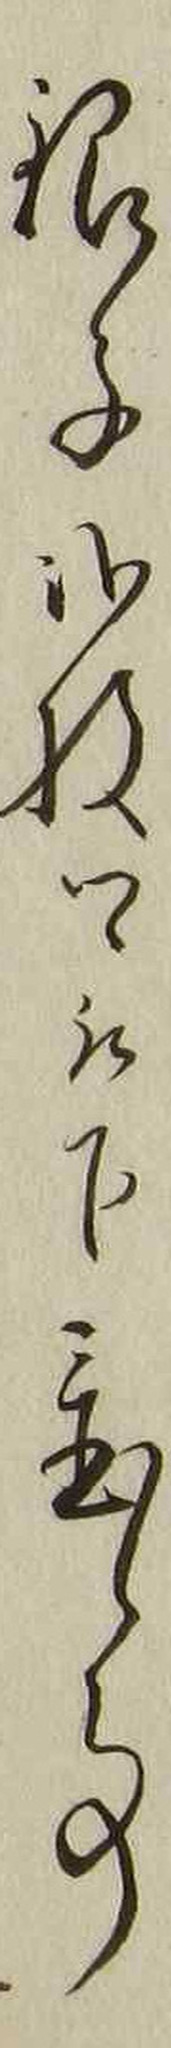銀子弐枚ツヽ被下置候事
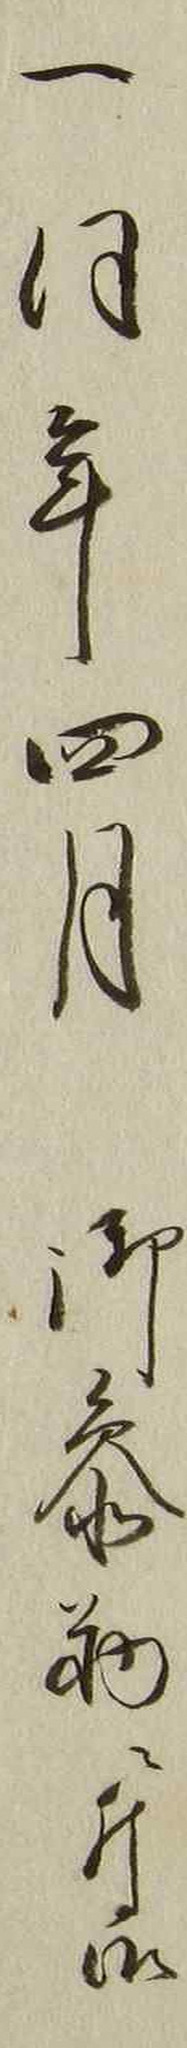一同年四月御参勤ニ付御
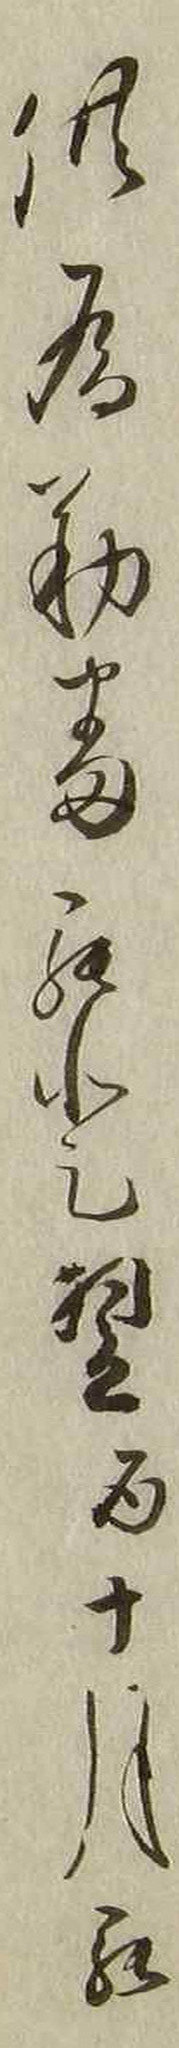供為勤番罷登翌酉十月罷
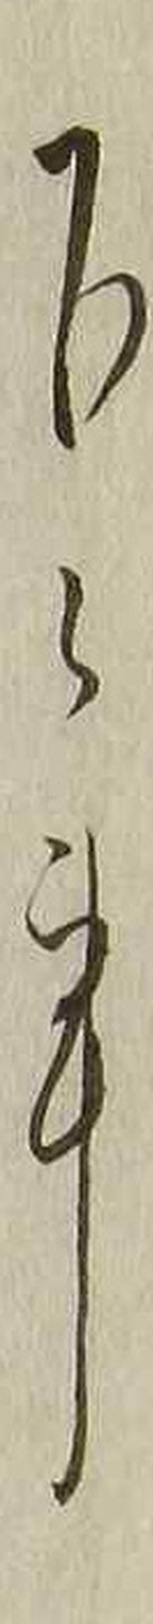下候事
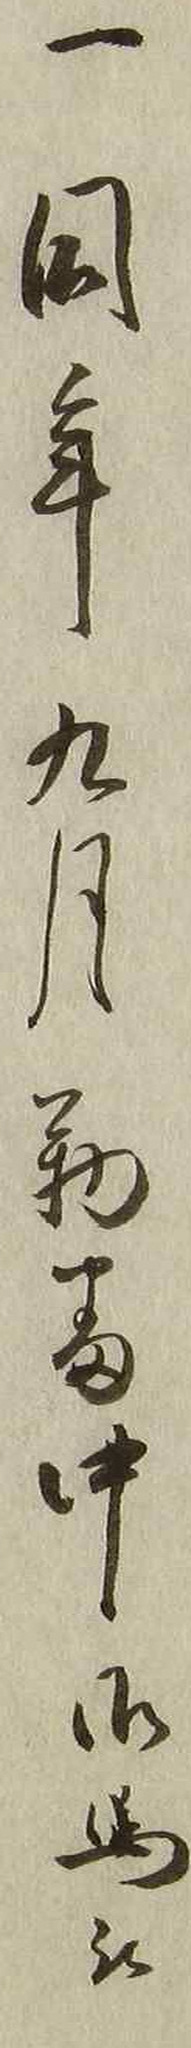一同年九月勤番中御馬被
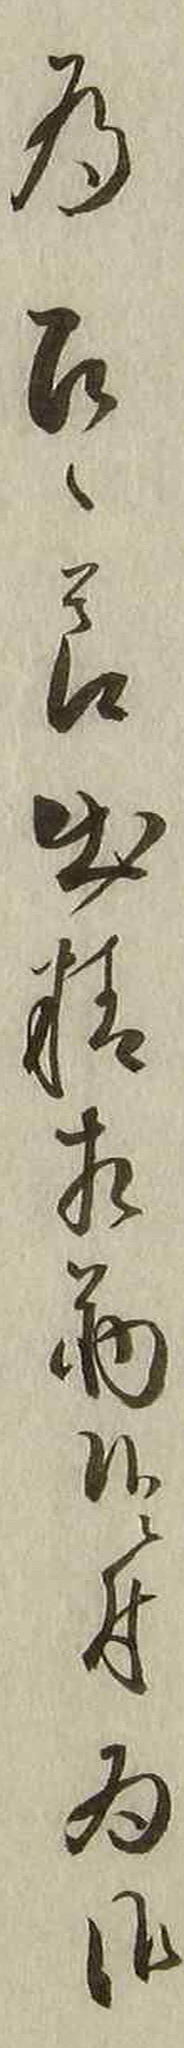為召候節出精相勤候ニ付為御
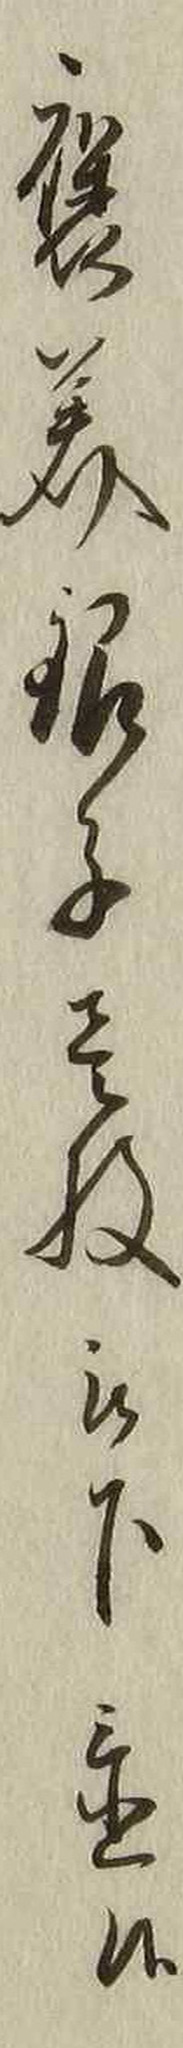褒美銀子壱枚被下置候事
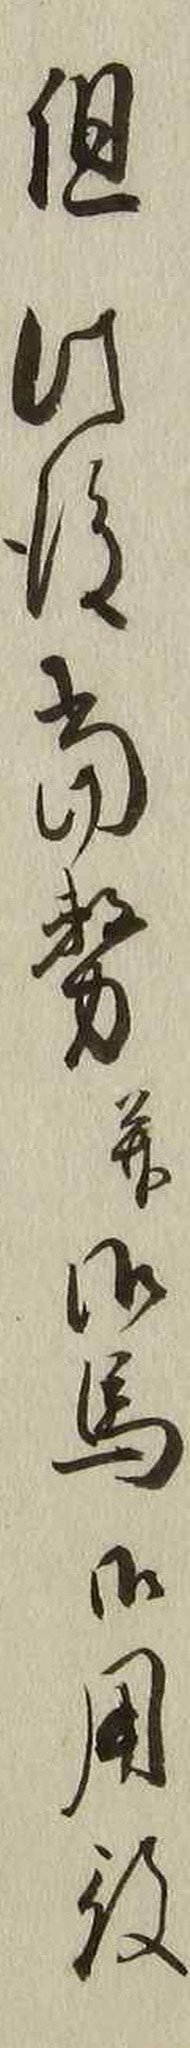但此後当務并御馬御用役
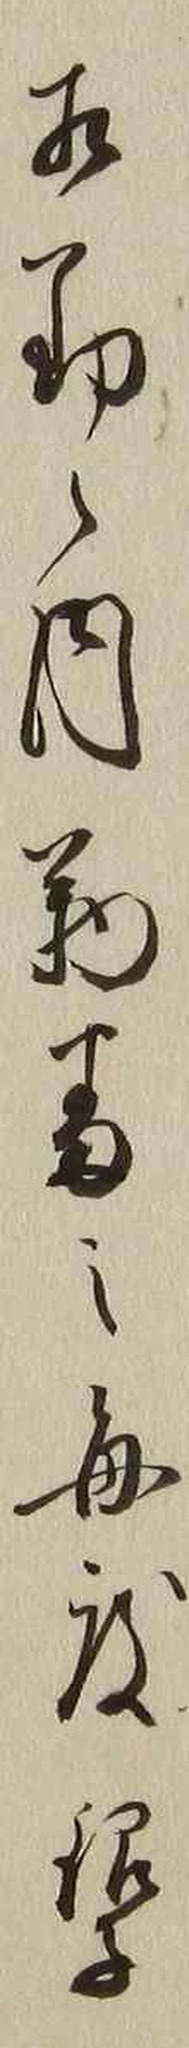相勤候内勤番之毎度銀子
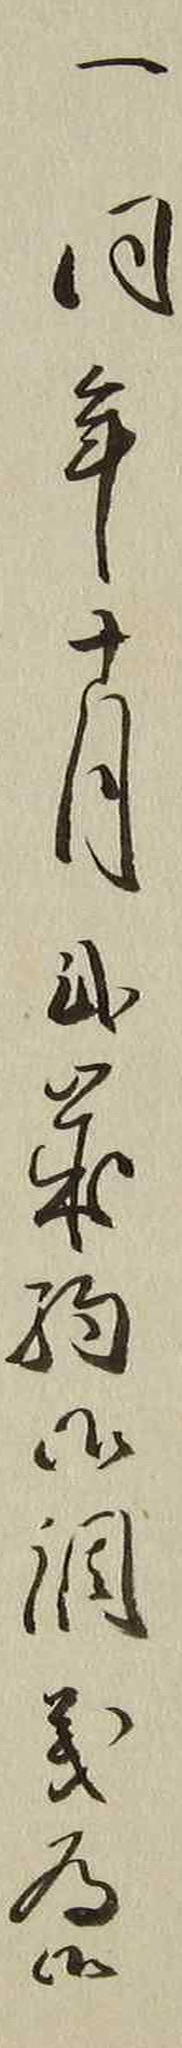一同年十月弐歳駒御調義為御
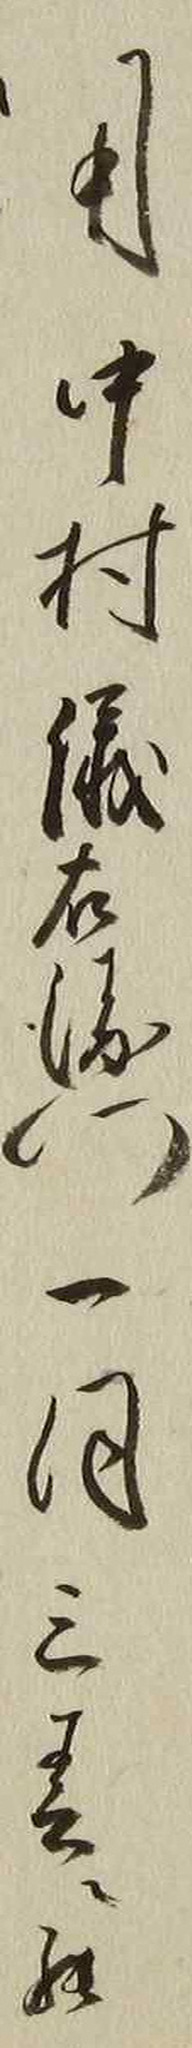用中村儀右衛門一同三春ニ罷
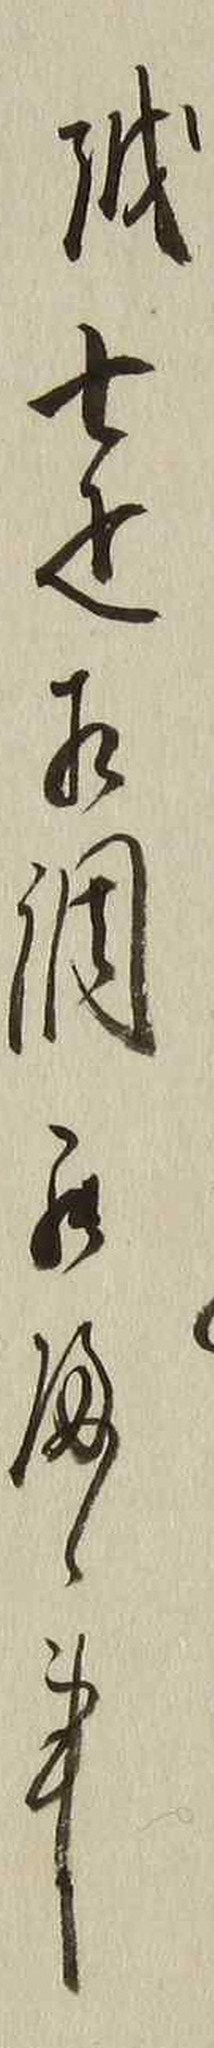越七疋相調罷帰候事
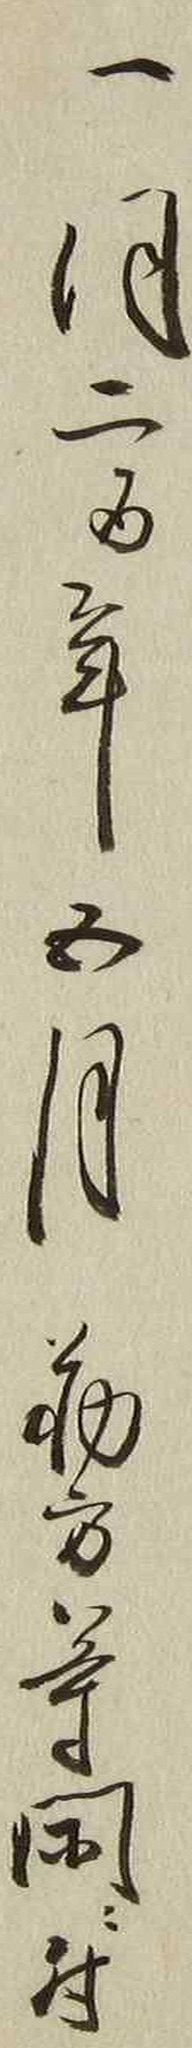一同二酉年五月勤方等閑ニ付
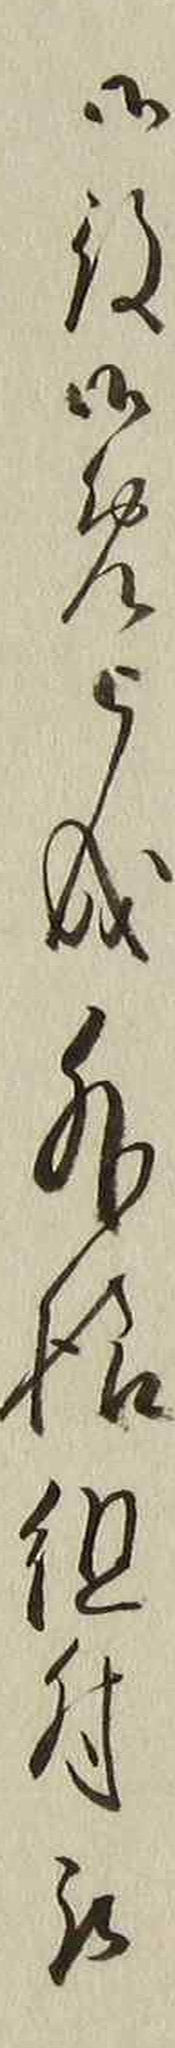御役御免被成外様組付被
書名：諸士系譜　巻之18　い之部18
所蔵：会津若松市立会津図書館
